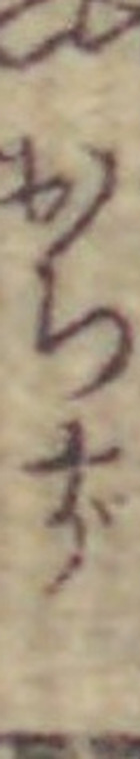おちず
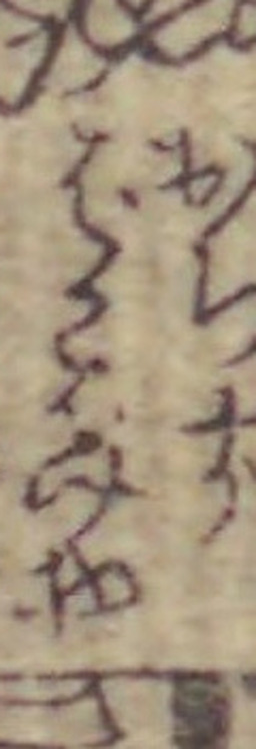ばかばけ物
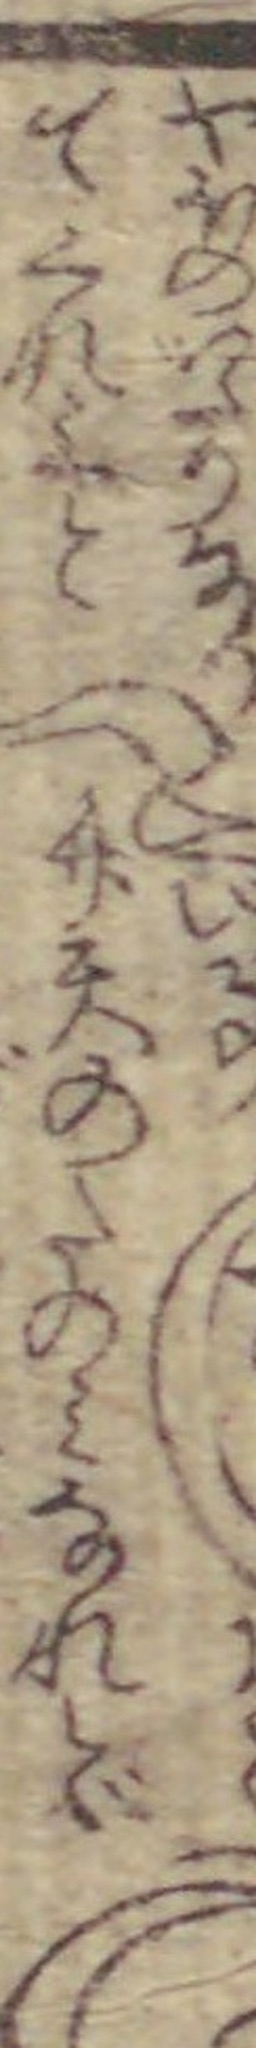てくれふと弁天のたのみなれど今この
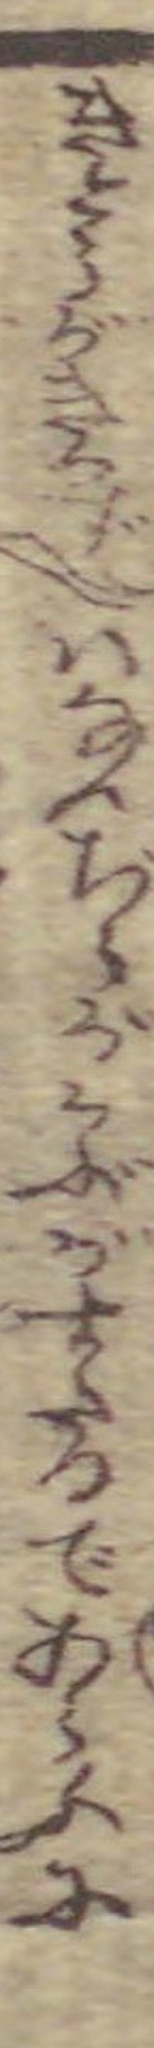きとうがきかずはなんぢらがかぶがすたるであらふに
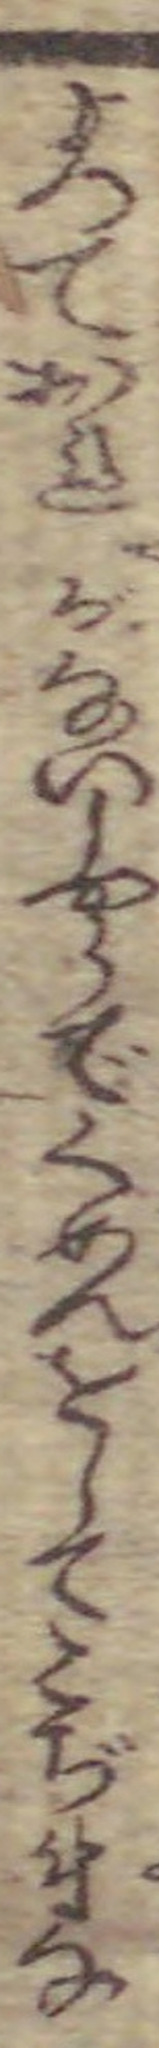よつておれがないしやうでくめんをしてこぢまな
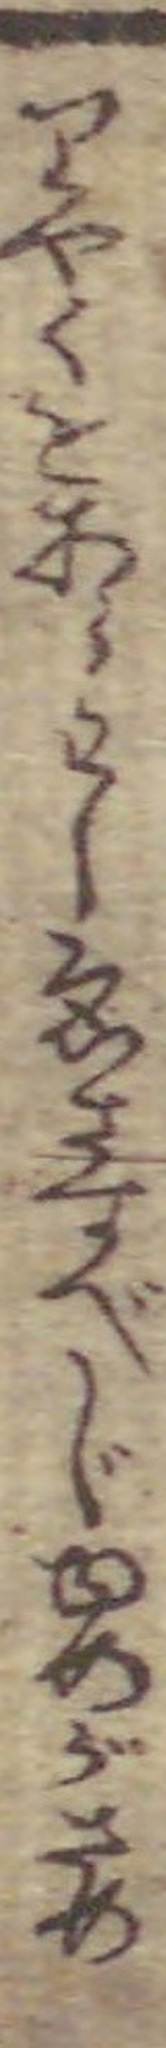りやくをあらわしゑさすべじゆめがさめ
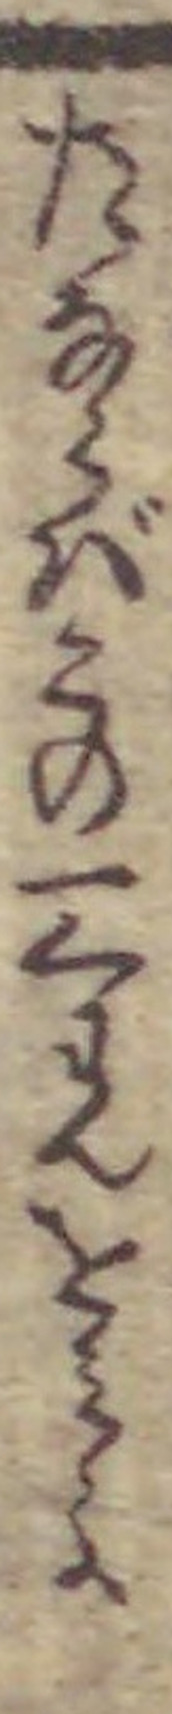たならばこの一くわんをみよ
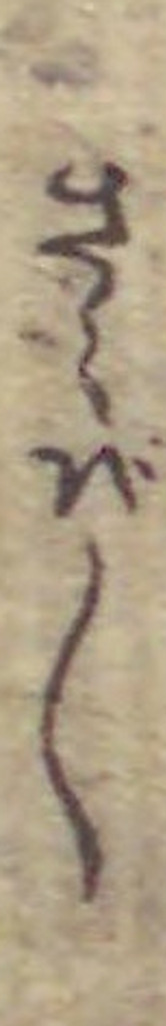さらば〳〵

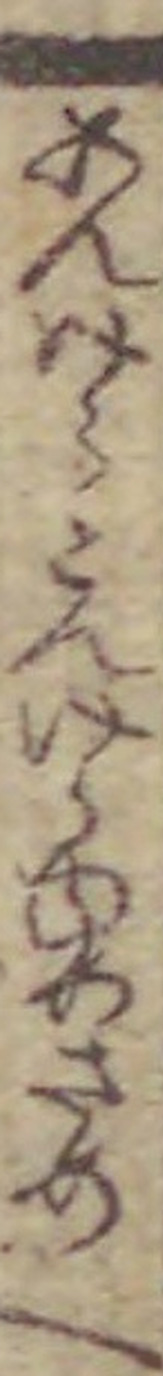あんけらこんけらゆめさめ
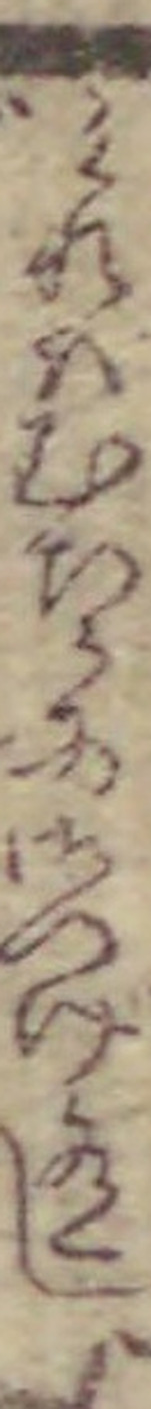たれはむちうに御つげありし
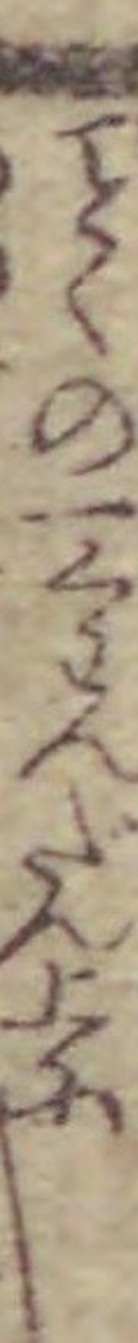ごとくの一くわんだん上に
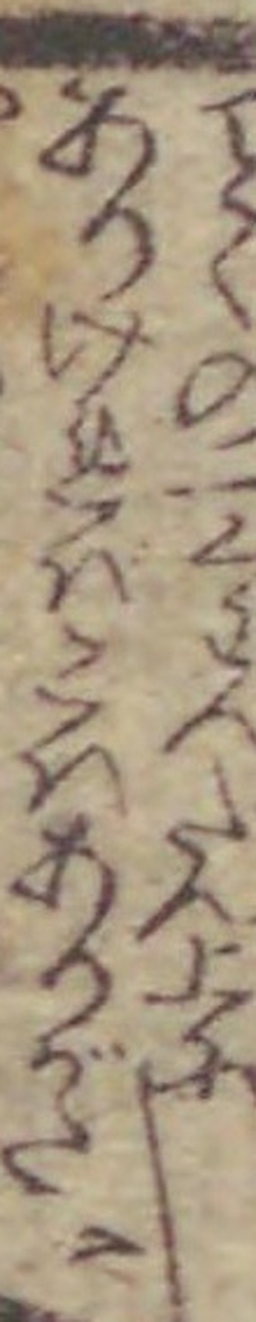ありければこはありがた
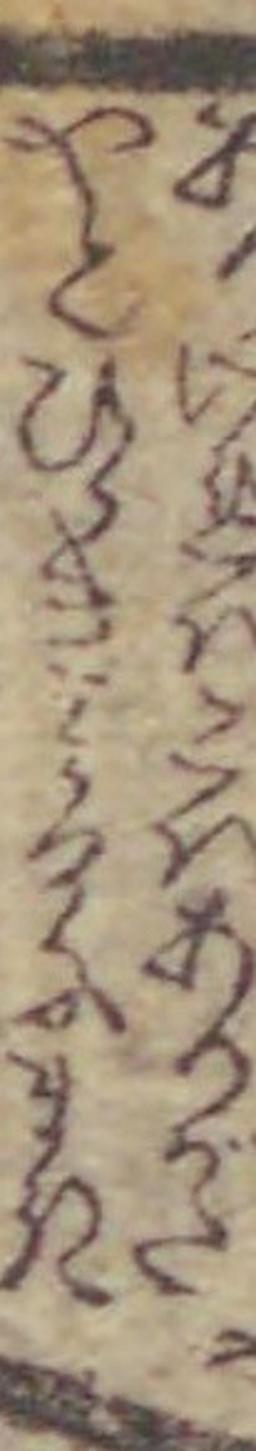やとひらきみるにまき
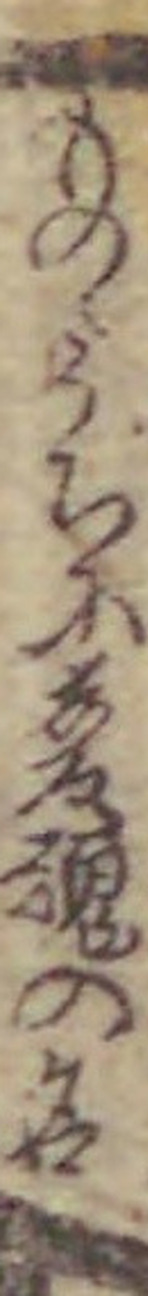ものゝうちに変魂の名法
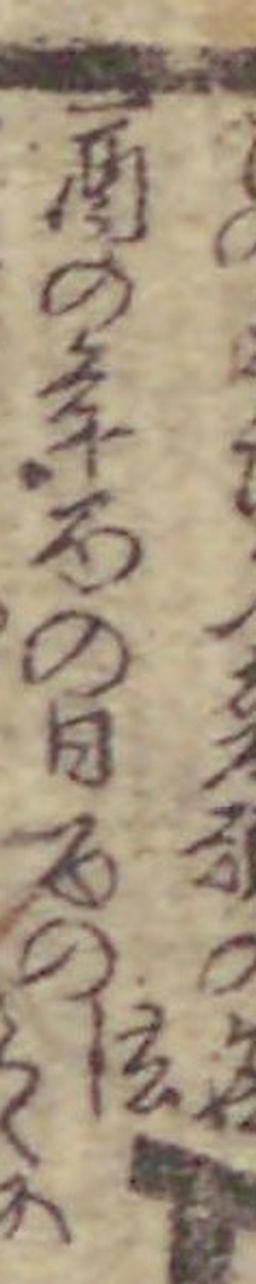一酉の年酉の日酉のこくに
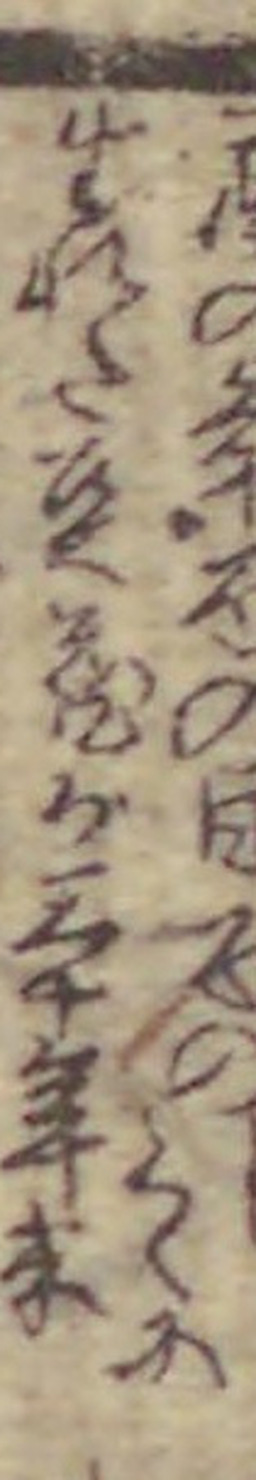生れた豆蔵が三十年来
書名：止而道致虚録 3巻
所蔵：国立国会図書館 National Diet Library, JAPAN
